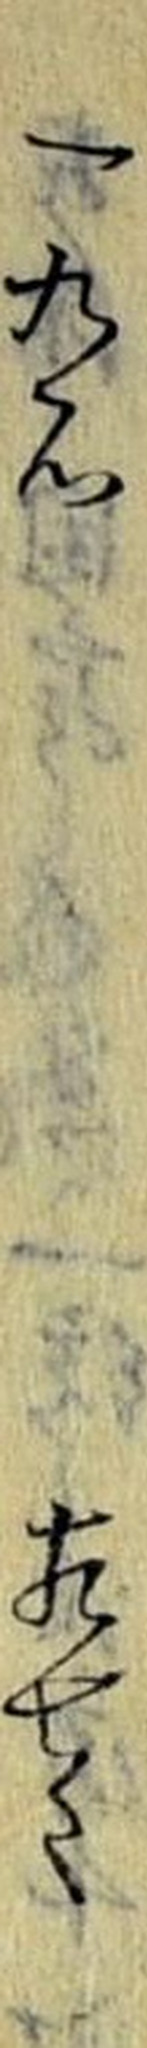一九石拾七匁
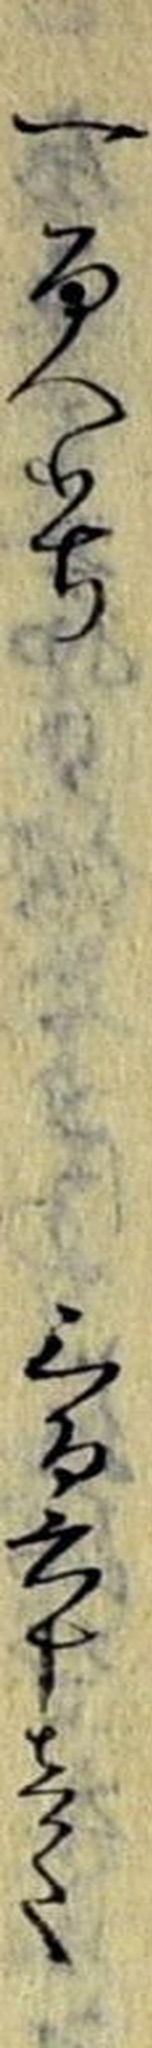一百人ふち三百六十壱匁
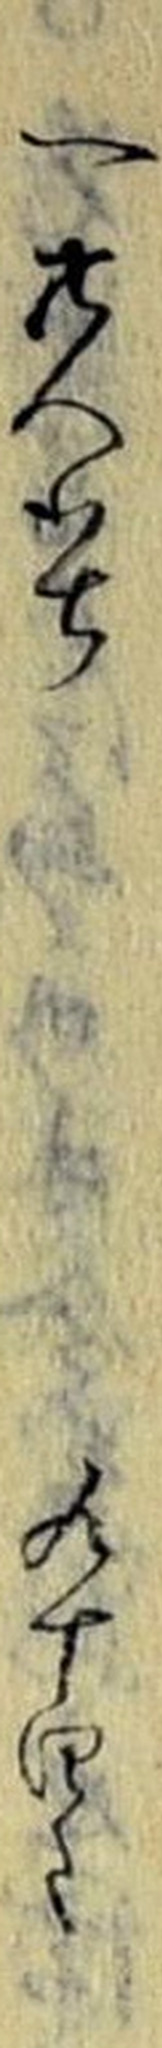一廿人ふち九十四匁
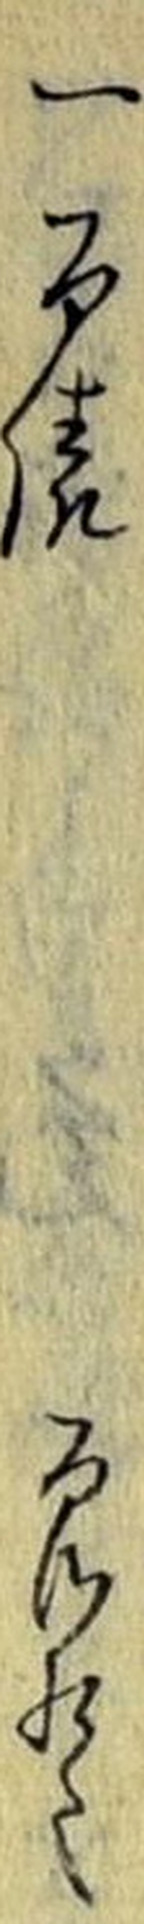一百俵百弐拾匁
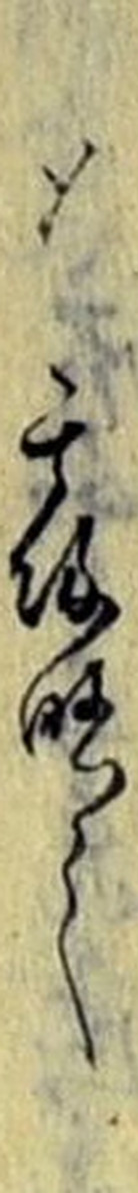〆其余略之
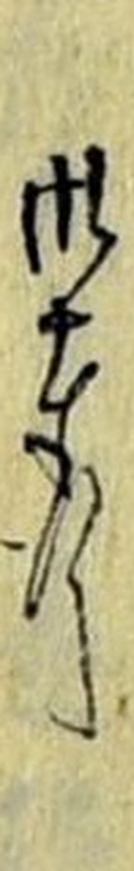御奉行
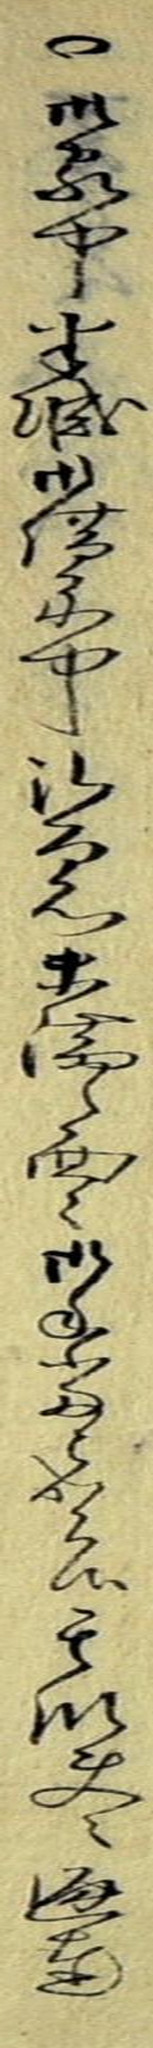○御家中半減御借米中弐百石未満之面々御手当被成下候其段夫々通達

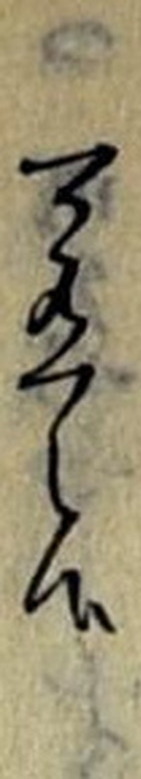可有之候
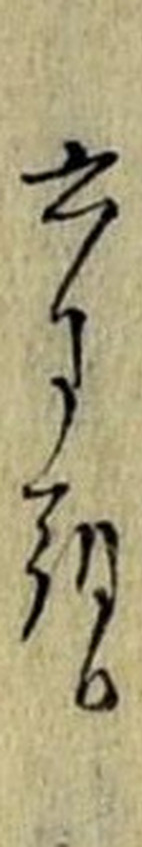六月朔日
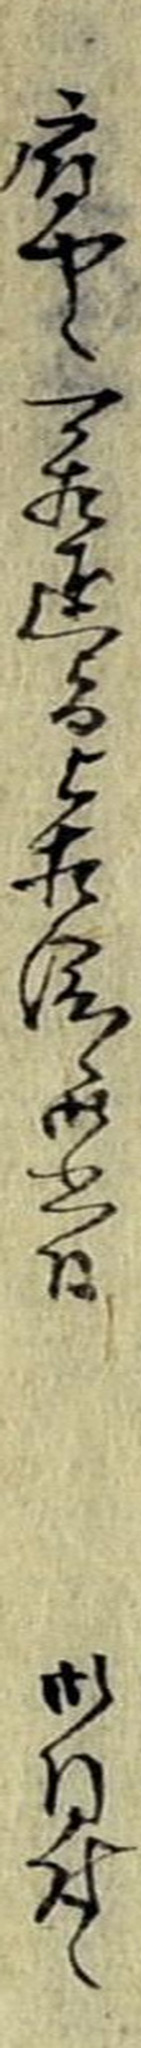府中へ可相達旨被相渡候御書付御目付へ
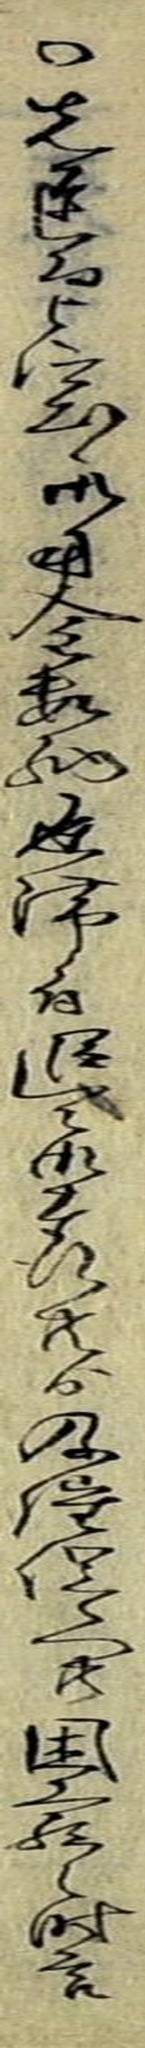○先達而被仰出候御用金段納遅滞に付追々御奉行共ゟ及催促候へ共困窮之時節
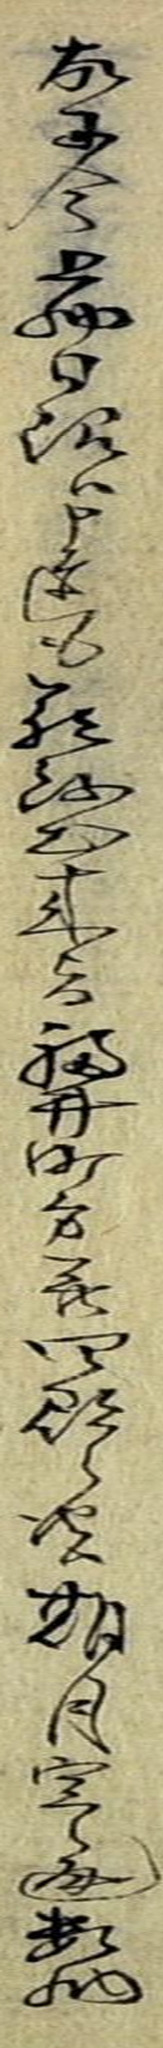故爾今上納日限は申達も難致出来旨福井町方并四郡之儀は期日定之通段納
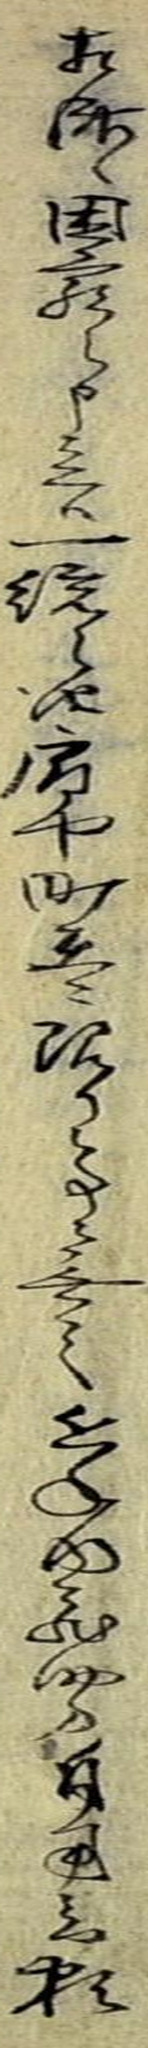相済候困窮之申立は一統之儀府中町在々限り事に無之近年内蔵助方自用に而頼
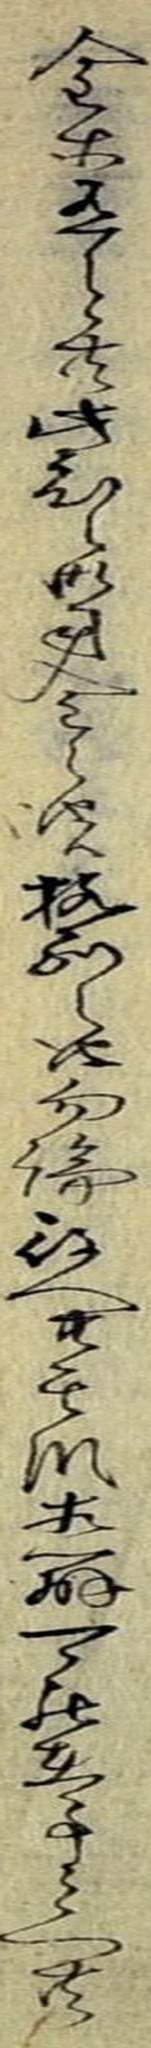金等有之候共此度之御用金之儀は格別之儀勿論役人共其段相辨可罷在事に候へ共
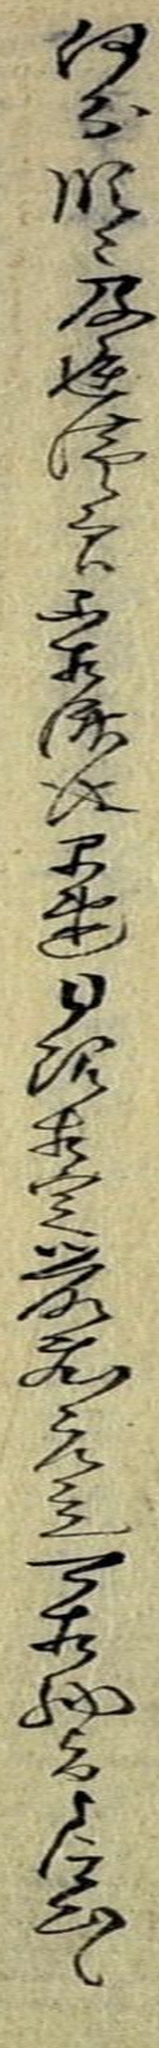何分段々及遅滞候而は不相済儀早速日限相定厳敷取立可相納旨被仰出候
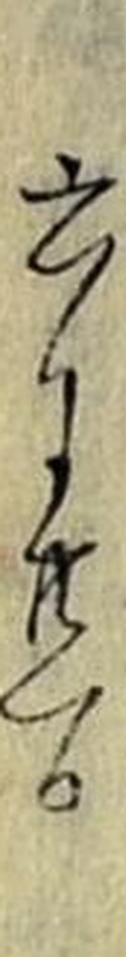六月廿一日
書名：命令之部 四
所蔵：福井県文書館 Fukui Prefectural Archives
